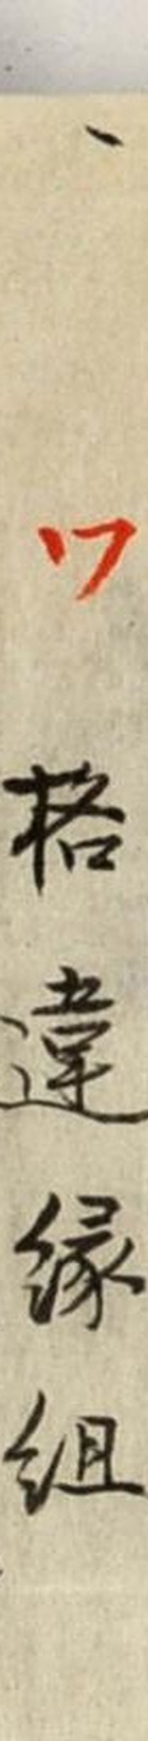ワ格違縁組
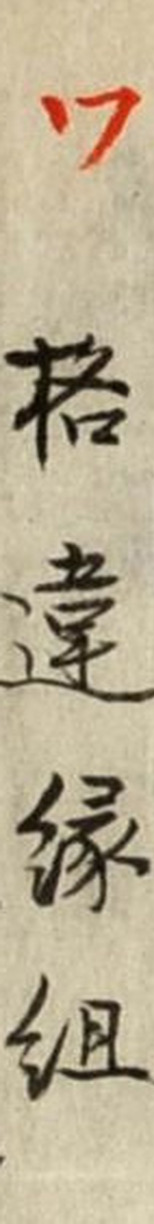ワ格違縁組
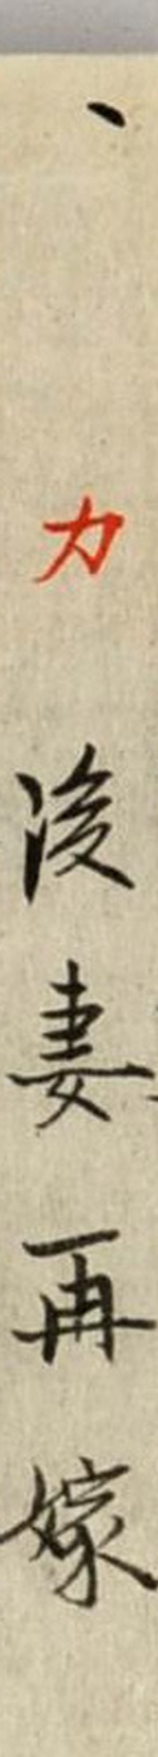カ後妻再嫁
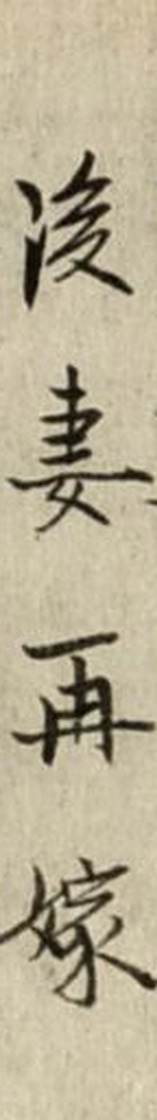カ後妻再嫁
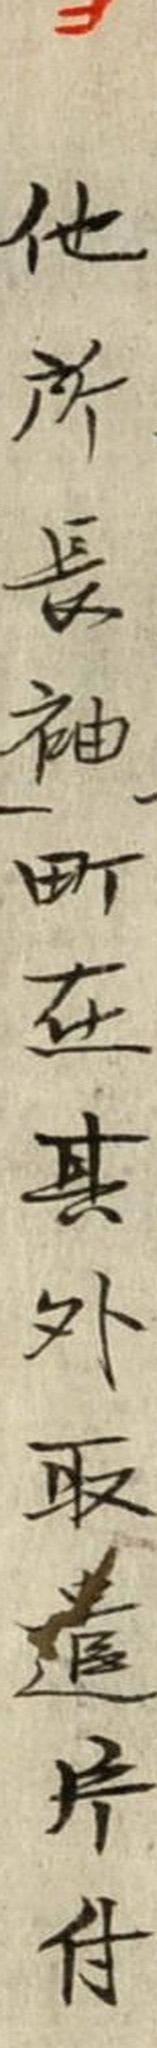ヨ他所長袖町在其外取遣片付
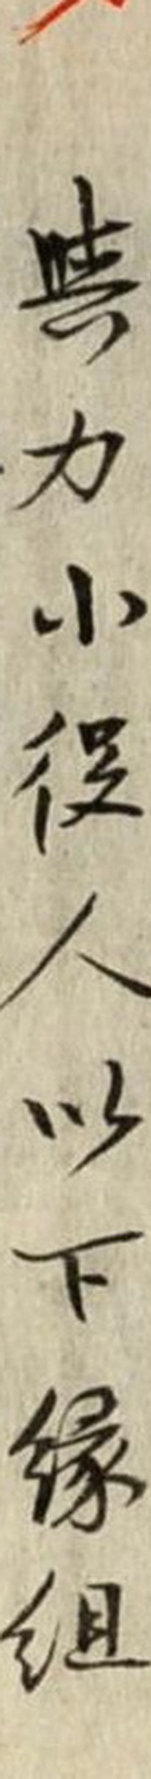タ与力小役人以下縁組
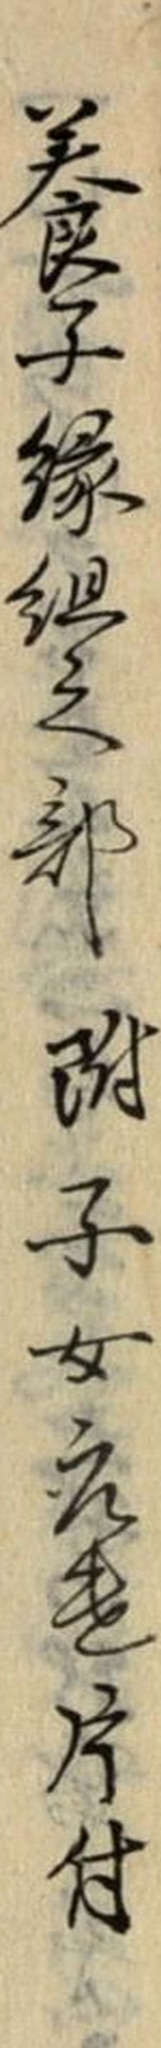養子縁組之部附子女取遣片付
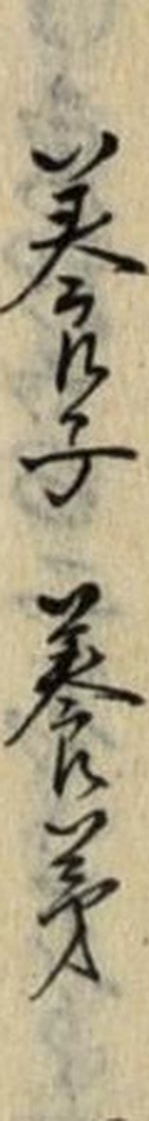養子養弟
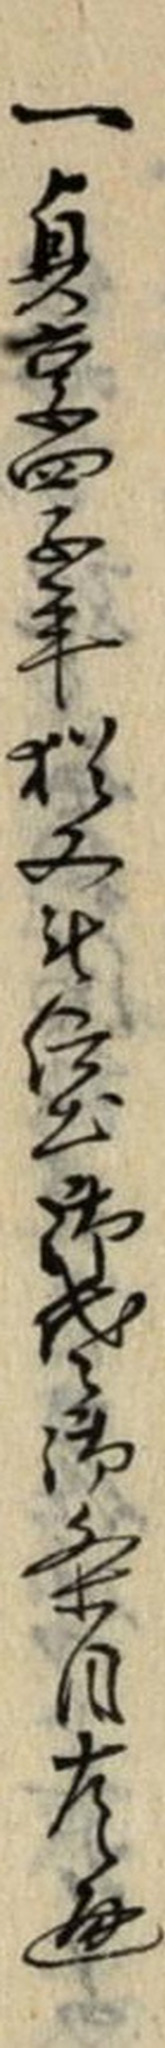一貞享四子年猶又被仰出御代々御条目左之通
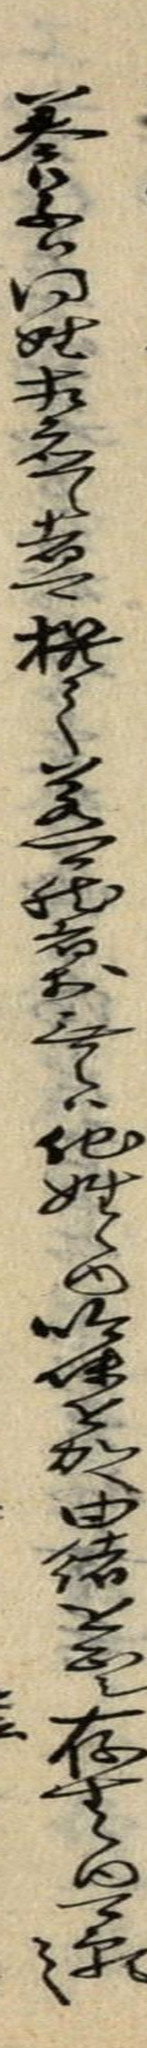養子は同姓相応之者可撰之若可然者於無之は他姓之内吟味を加へ由緒を正し存生之内可願之
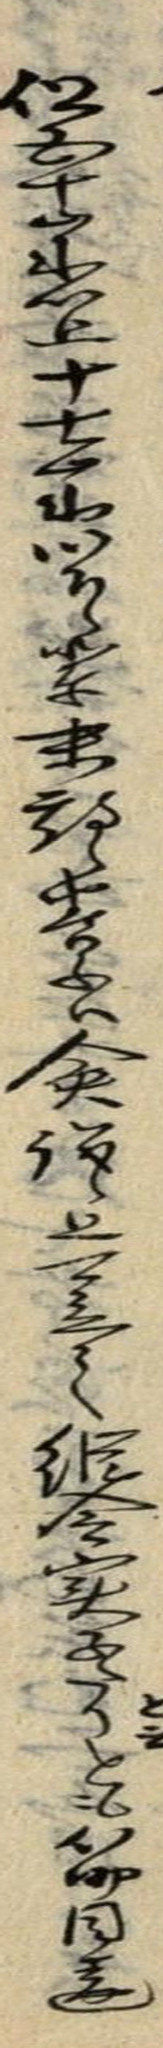但五十歳以上十七歳以下之輩末期之養子は僉議之上可立之縦令実子たりとも筋目違
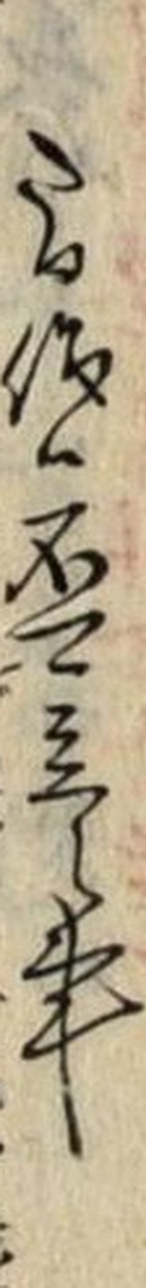たる儀は不可立之事
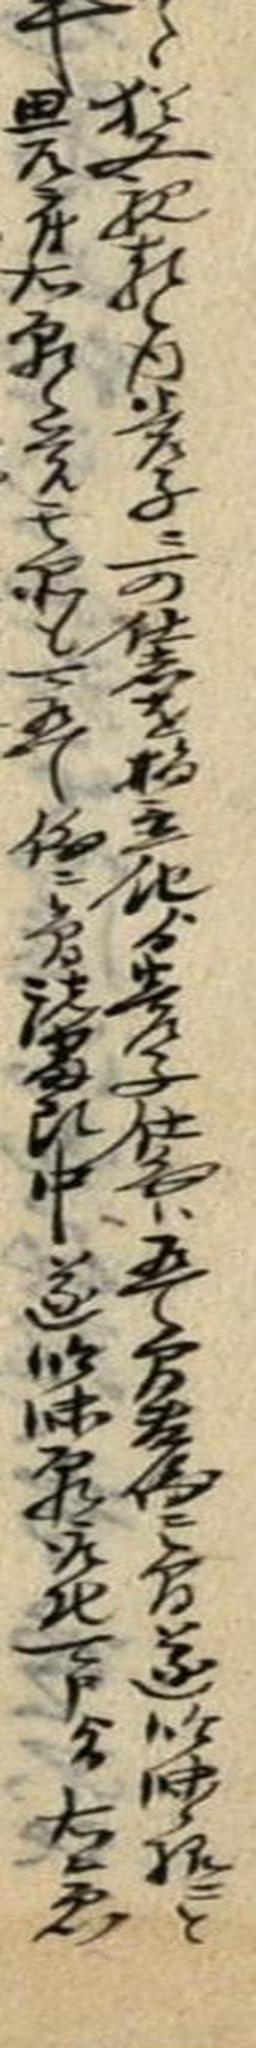思召に付右願之節其品も可有之儀に候間諸番頭中遂吟味願取次可申旨右急
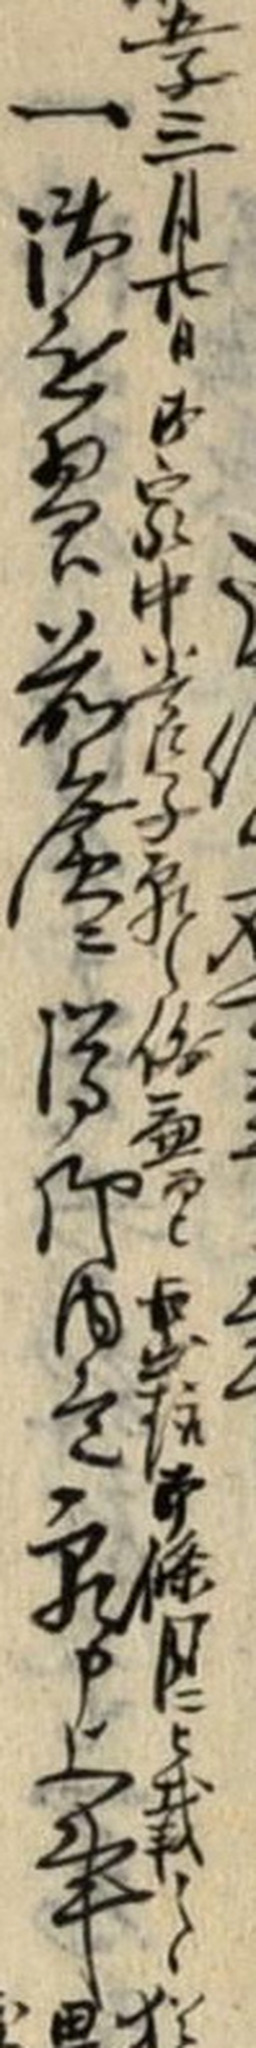一御近習は前広に得御内意願申上事
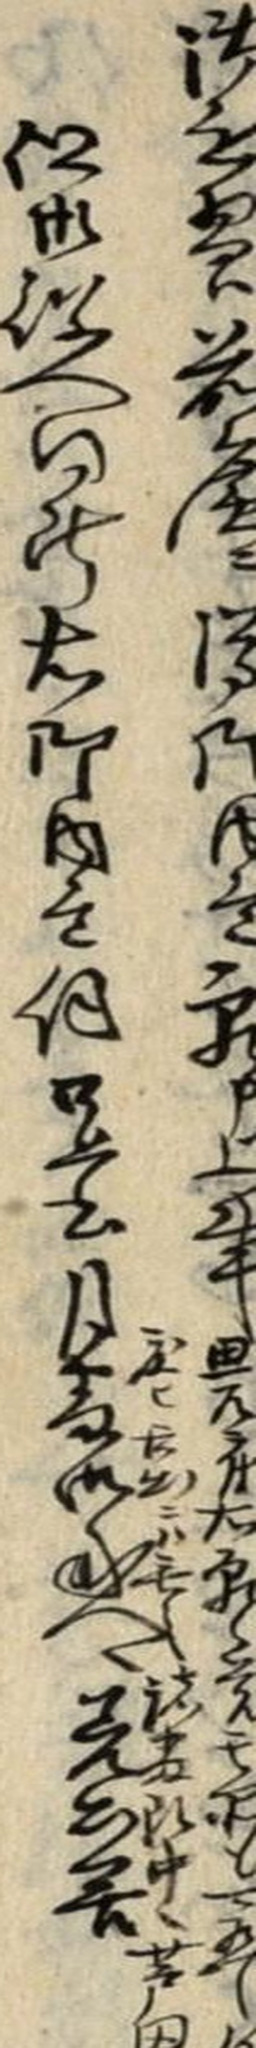但御役人同断右御内意伺口上書月番御用人へ差出筈
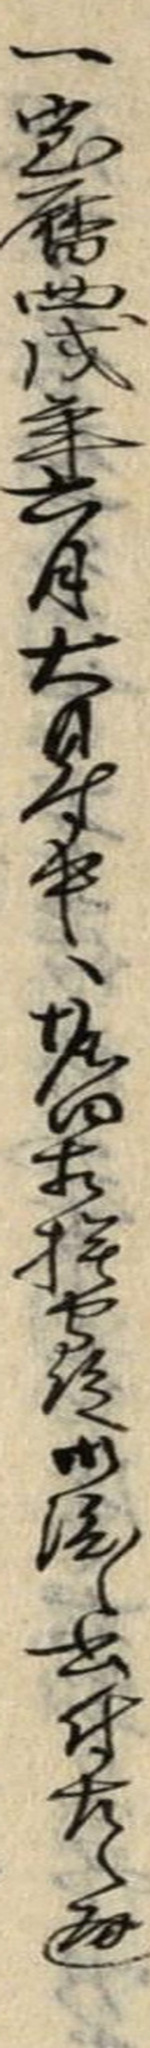一宝暦四戌年六月右大目付中へ堀田相模守殿へ御渡候書付左之通
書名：養子縁組之部
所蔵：福井県文書館 Fukui Prefectural Archives
